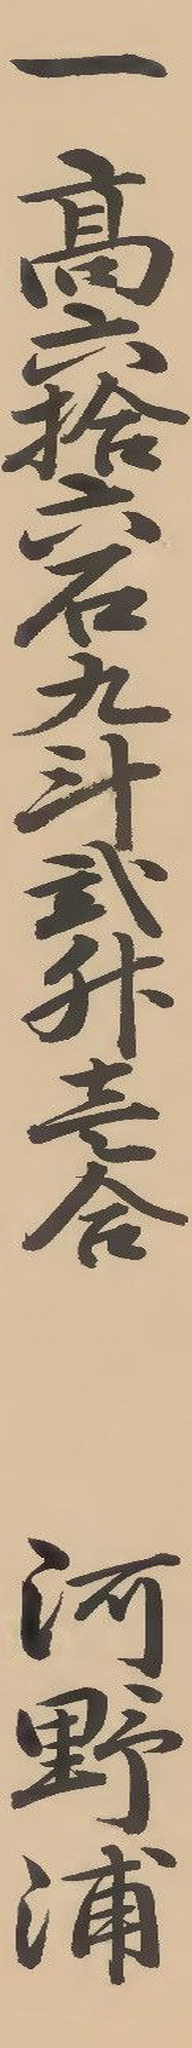一高六拾六石九斗弐升壱合河野浦
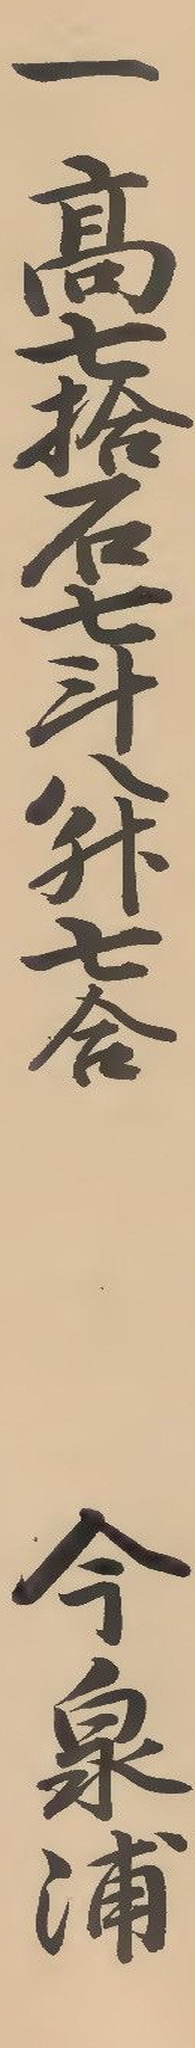一高七拾石七斗八升七合今泉浦
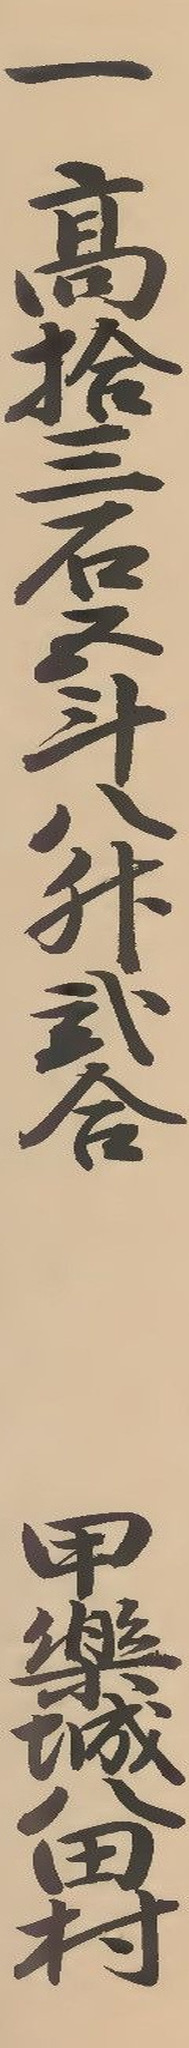一高拾三石五斗八升弐合甲楽城八田村
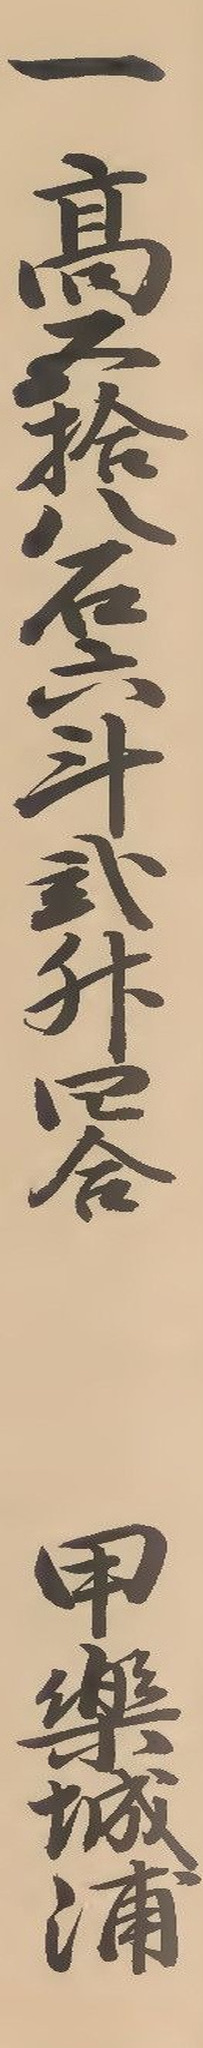一高五拾八石六斗弐升四合甲楽城浦
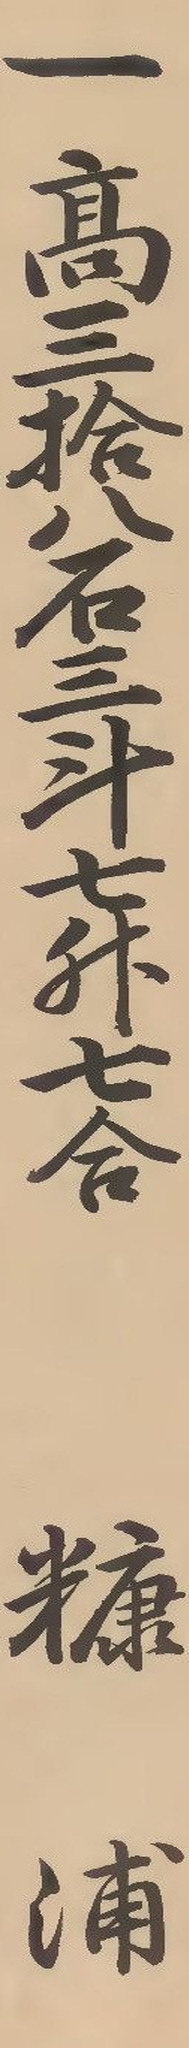一高三拾八石三斗七升七合糠浦
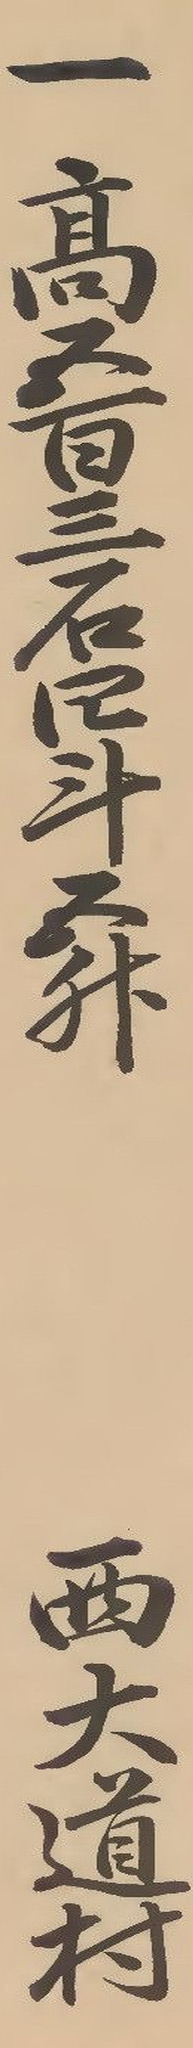一高五百三石四斗五升西大道村
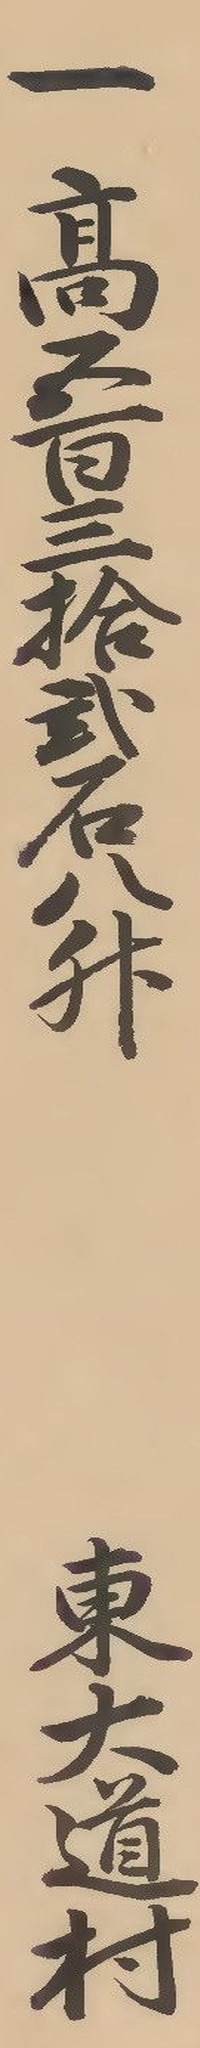一高五百三拾弐石八升東大道村

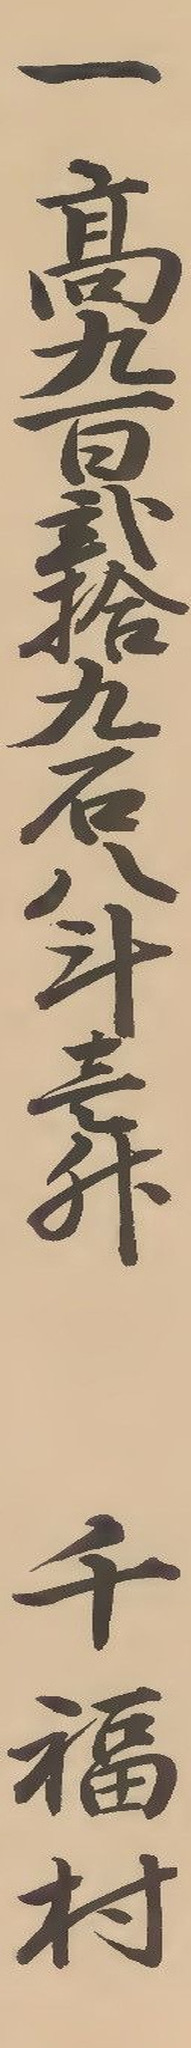一高九百弐拾九石八斗壱升千福村
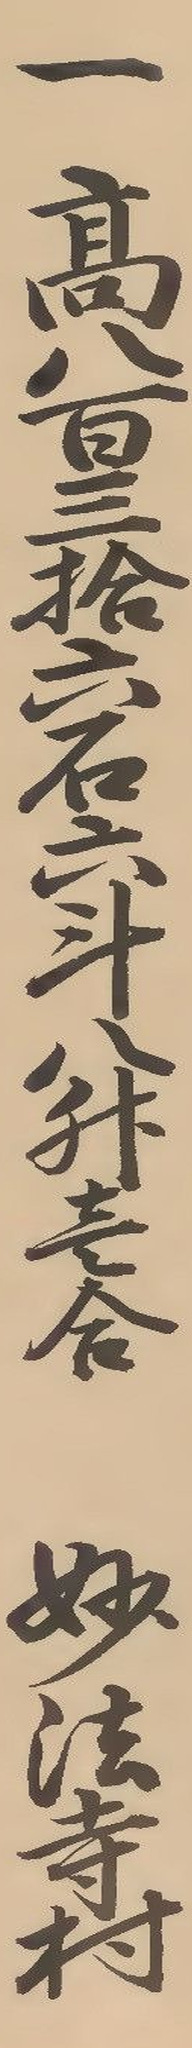一高八百三拾六石六斗八升壱合妙法寺村
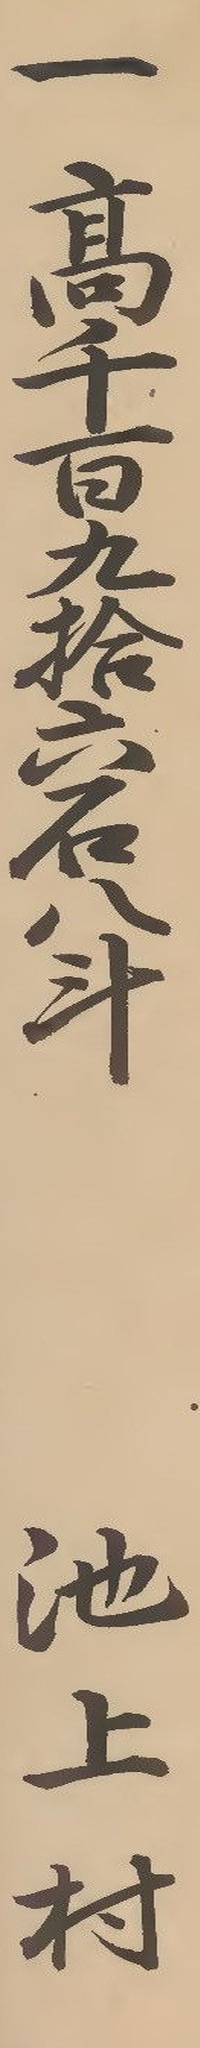一高千百九拾六石八斗池上村
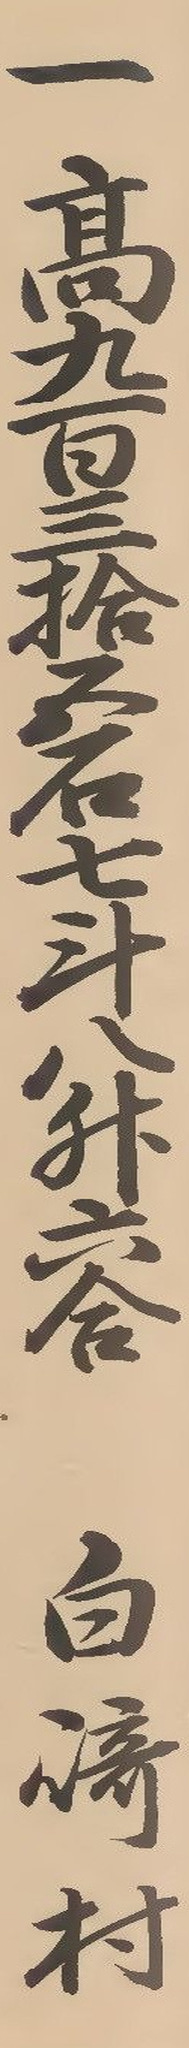一高九百三拾五石七斗八升六合白崎村
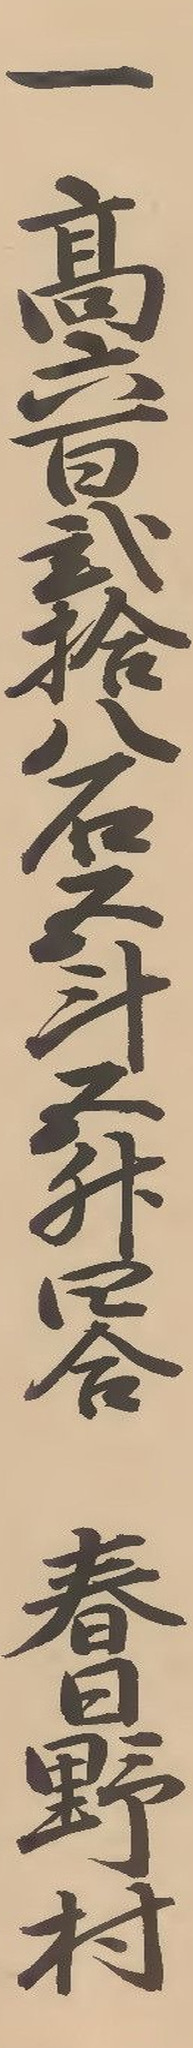一高六百弐拾八石五斗五升四合春日野村
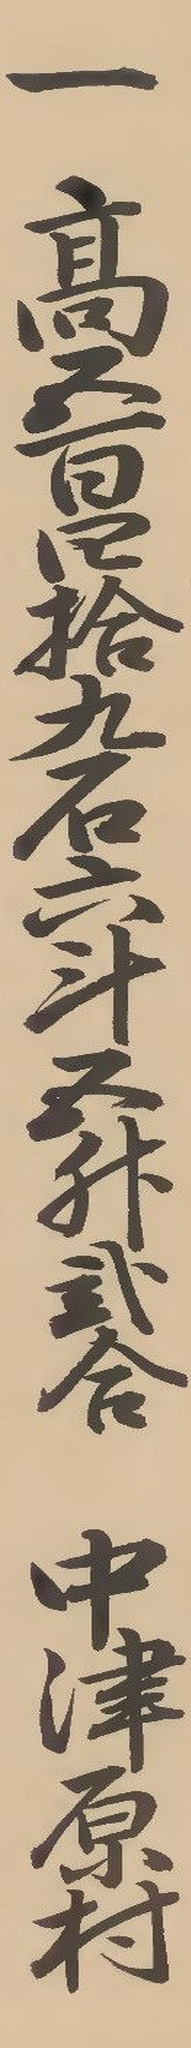一高五百四拾九石六斗五升弐合中津原村
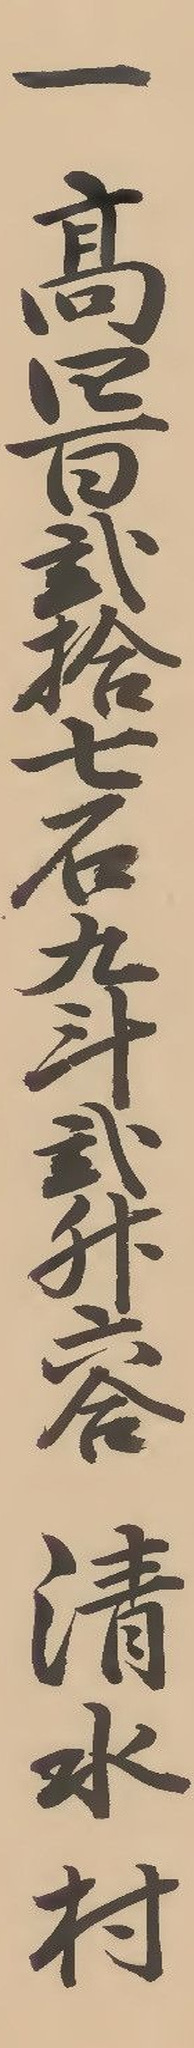一高四百弐拾七石九斗弐升六合清水村

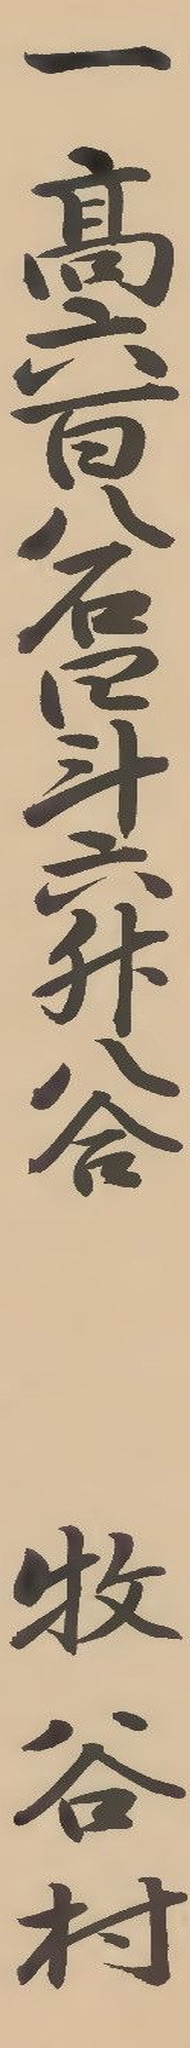一高六百八石四斗六升八合牧谷村
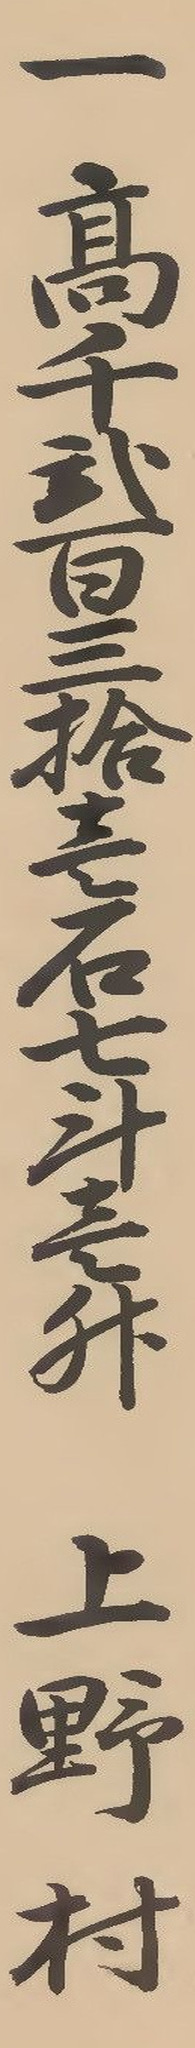一高千弐百三拾壱石七斗壱升上野村
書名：越前国郷帳
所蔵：国立公文書館 National Archives of Japan
